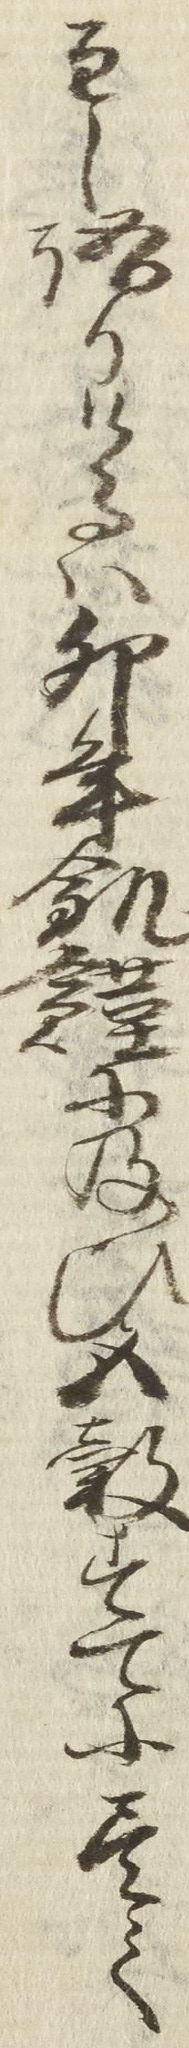主し語りけるは卯年飢饉に及ひ五穀すてに尽て
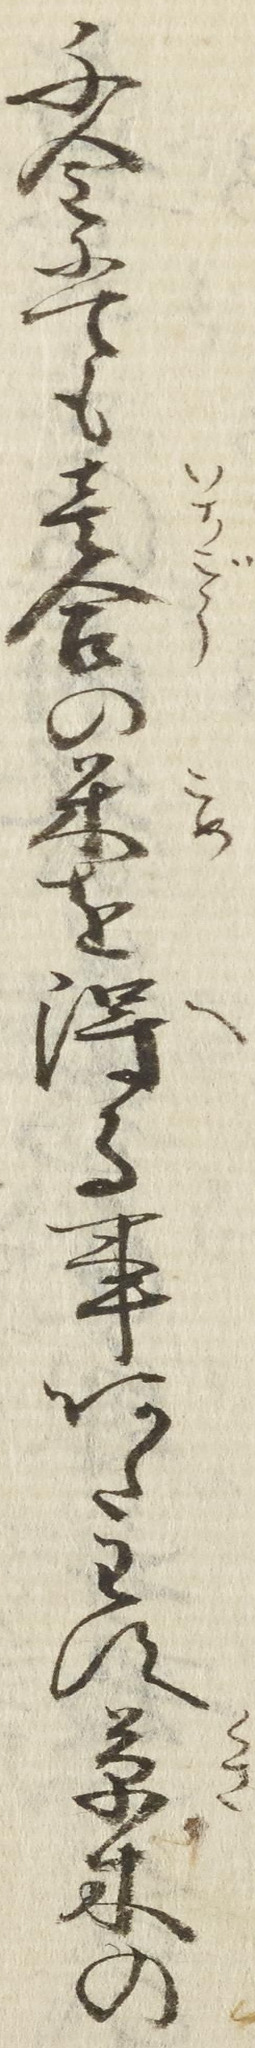千金にても壱合の米を得る事あたわす草木の
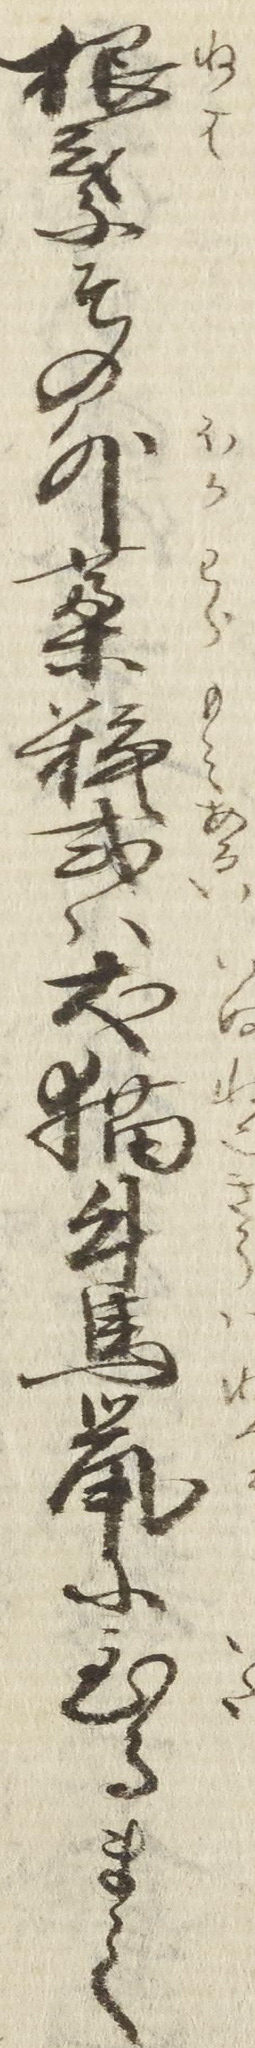根葉その外藁籾或は犬猫牛馬鼠に至るまて
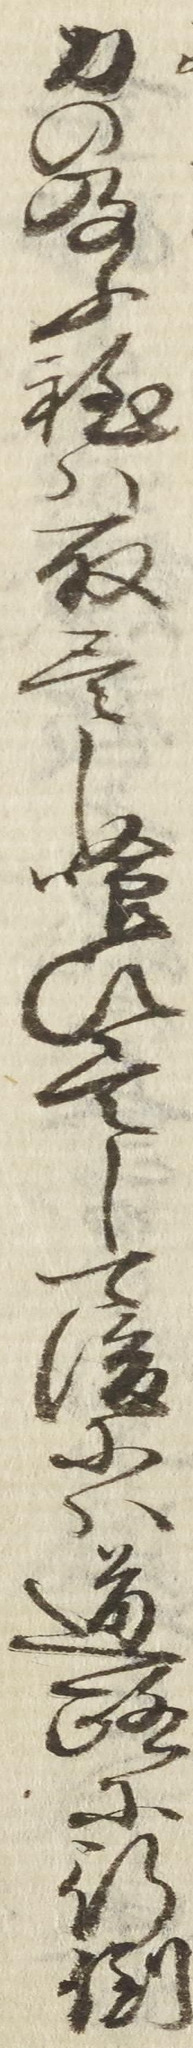力の及ふ程は取尽し喰ひ尽して後には道路に行倒
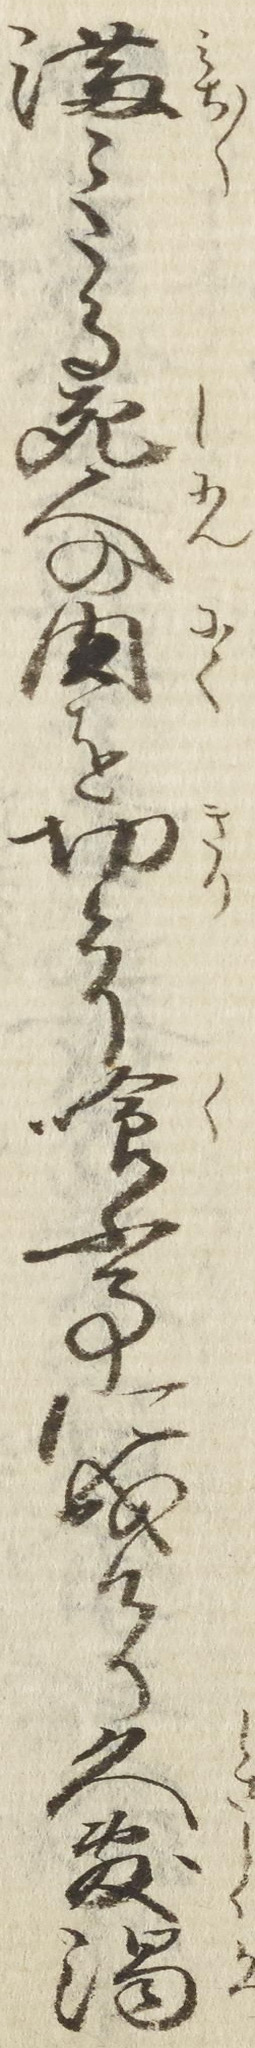満〻たる死人の肉を切とり喰ふ事に成けり久敷渇
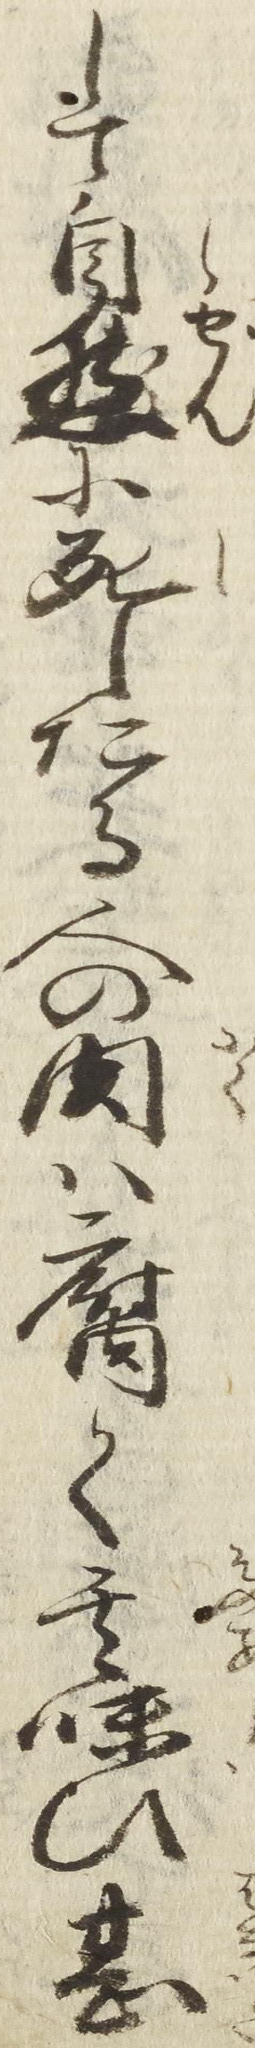して自然に死したる人の肉は腐て其味ひ甚
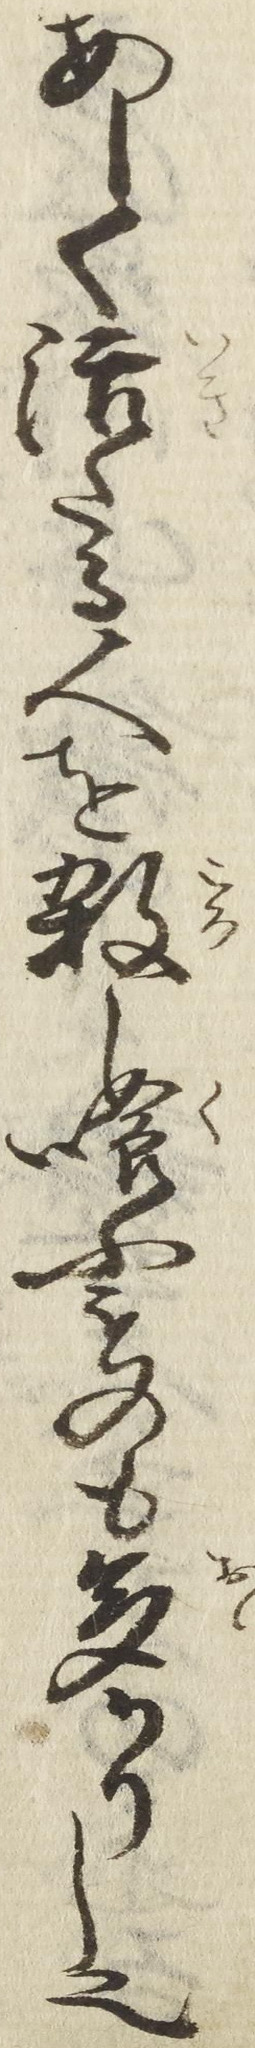あしく活たる人を殺し喰ふものも多かりし也

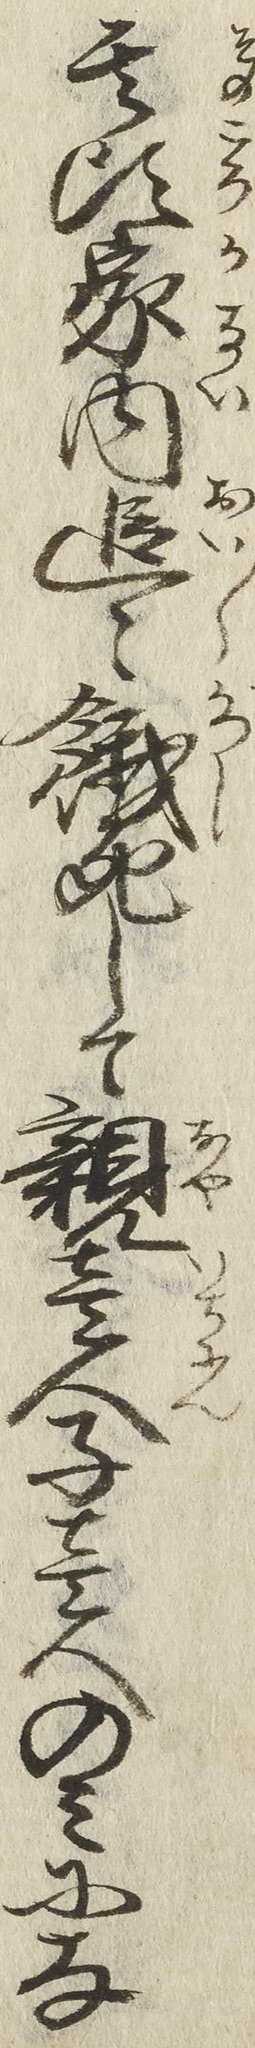其頃家内追〻餓死して親壱人子壱人のみにな
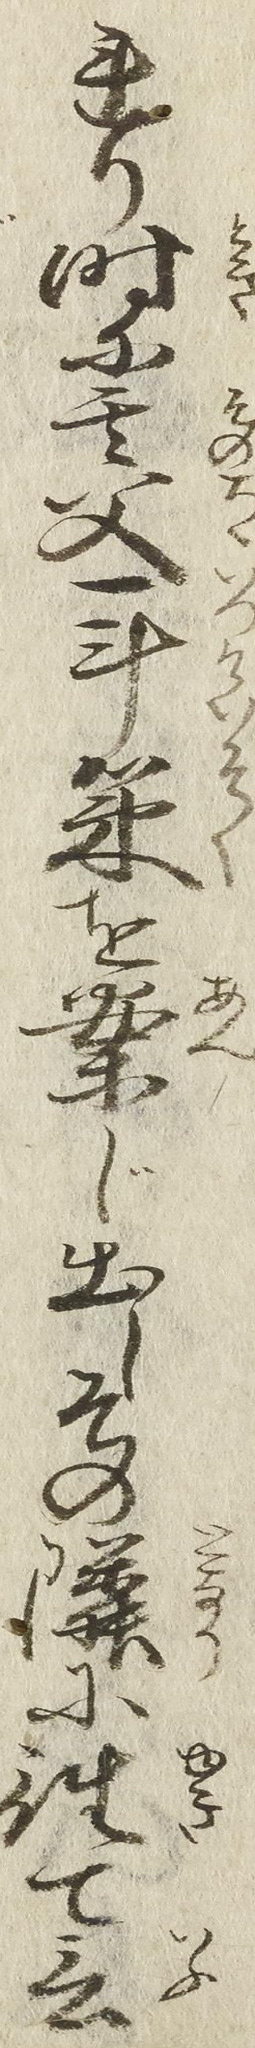れり時に其父一計策を案じ出しその隣に往て言
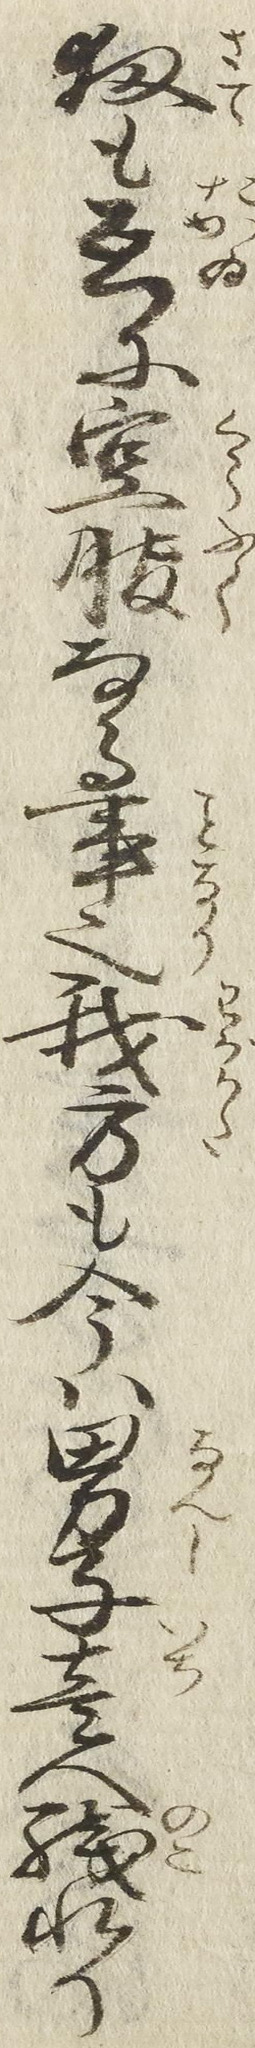扨も互に空腹なる事也我方も今は男子壱人残れり
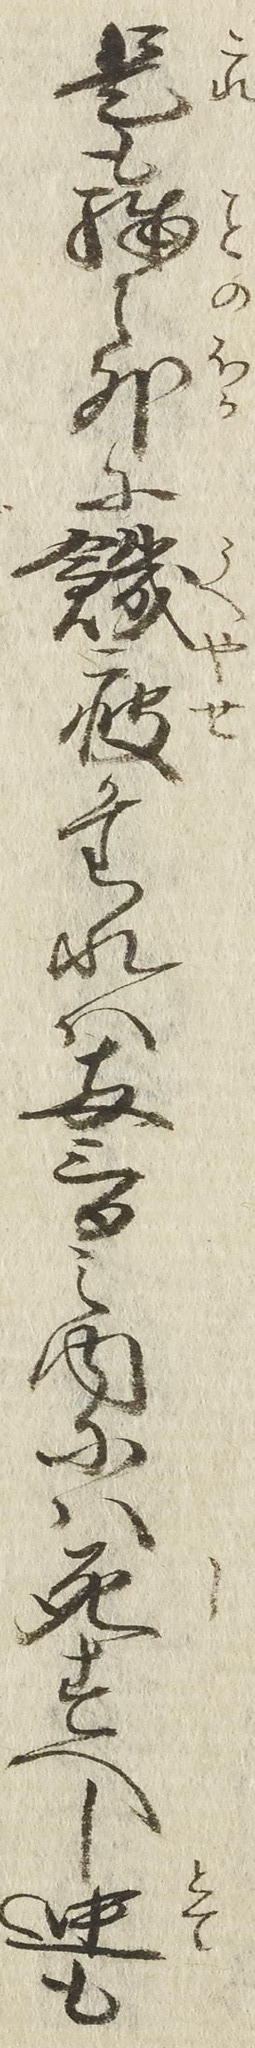是も殊之外に餓痩たれは両三日之内には死すへし迚も
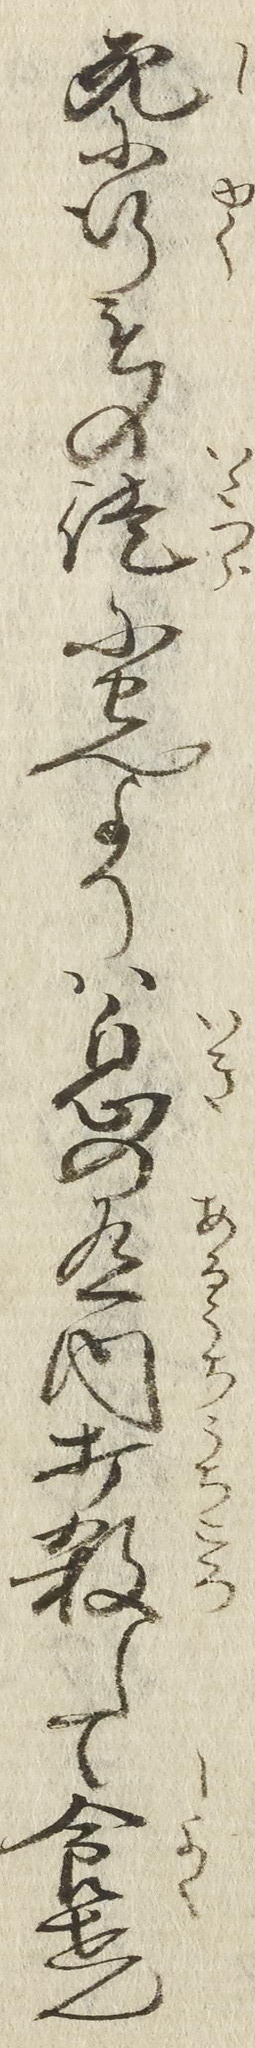死に行もの徒にせんよりは息の有内打殺して食せん
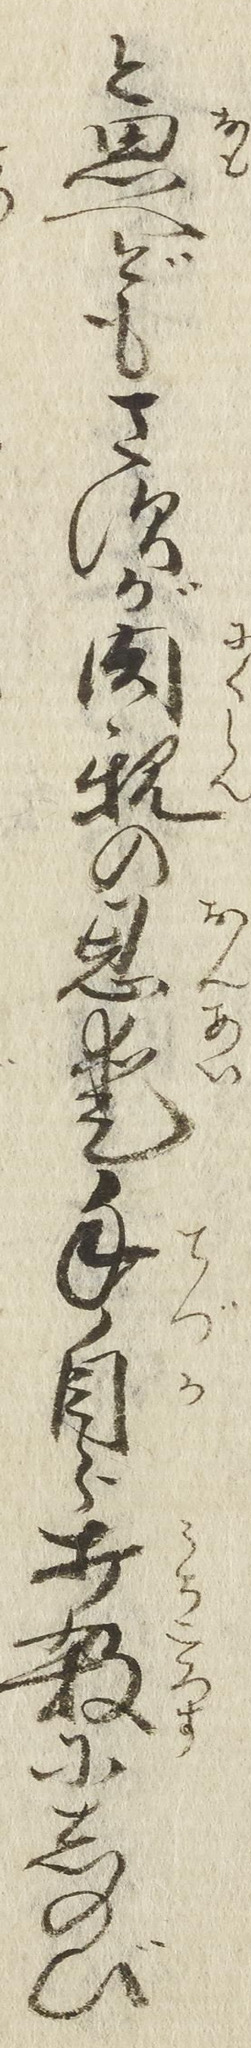と思へどもさすが肉親の恩愛手自ら打殺にしのび
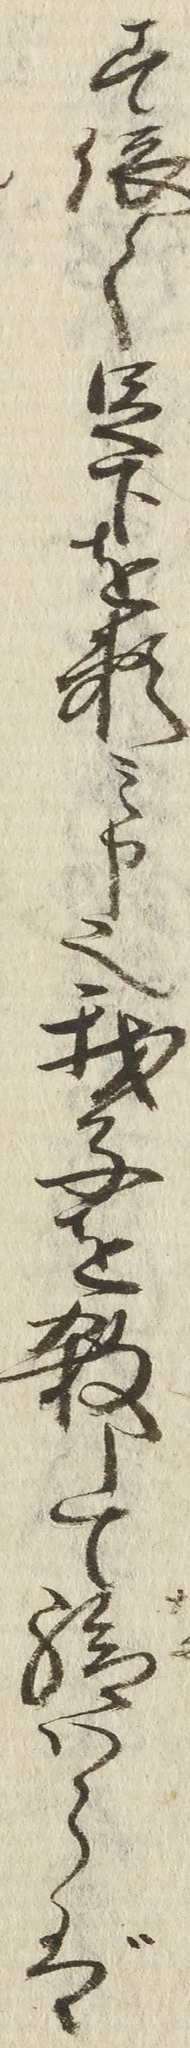ず依て足下を頼み申也我子を殺して給はらば
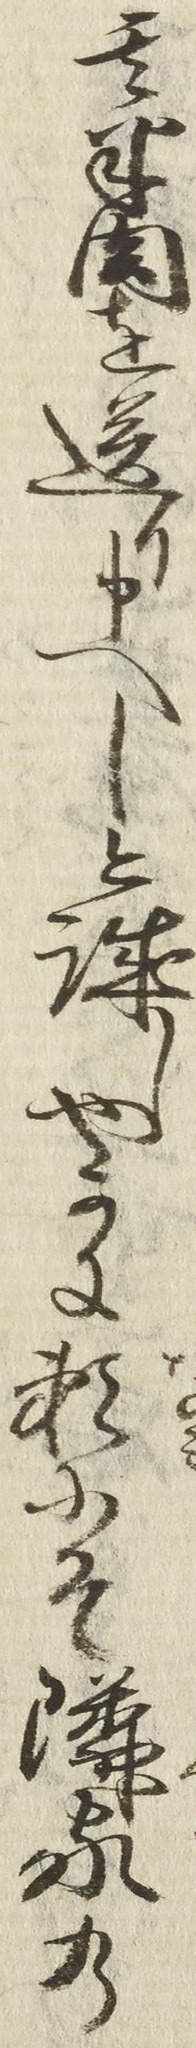其半肉を送り申へしと誠しやかに頼にそ隣家の
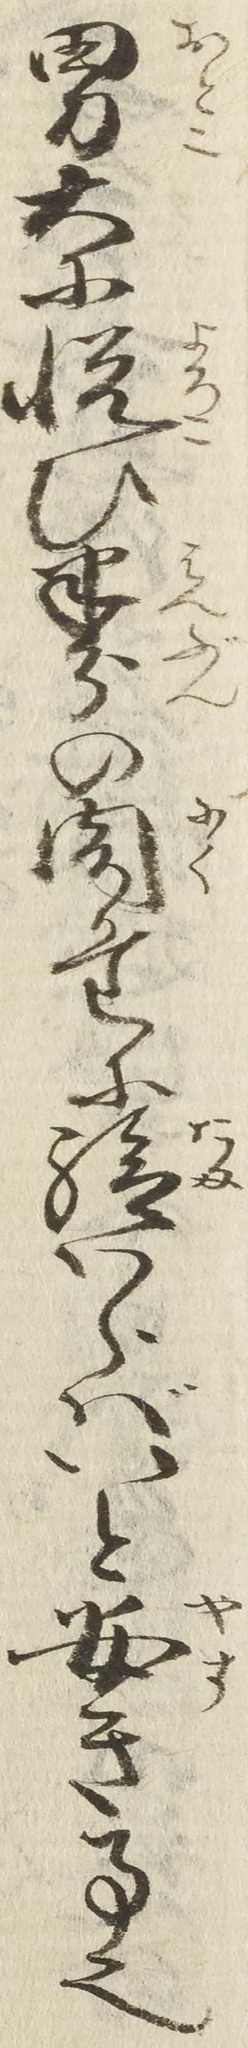男大に悦ひ半分の肉たに給はらばいと安き事也
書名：天明奇畧　全
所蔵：東京大学地震研究所図書室 Earthquake Research Institute Library, The University of Tokyo, JAPAN
